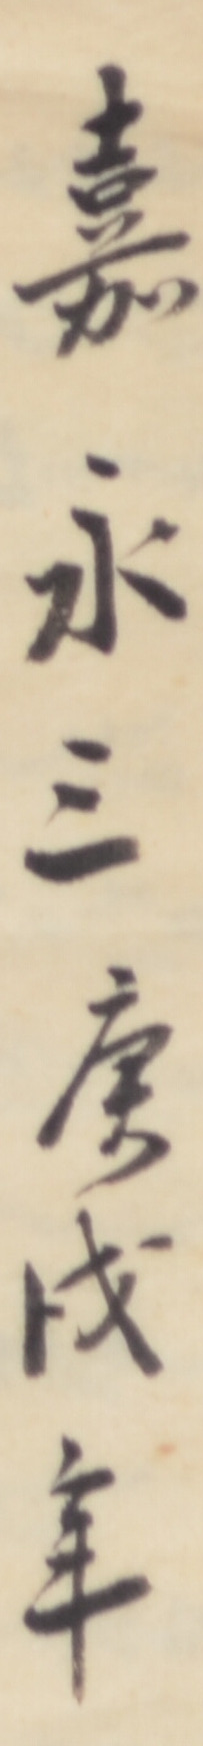嘉永三庚戌年
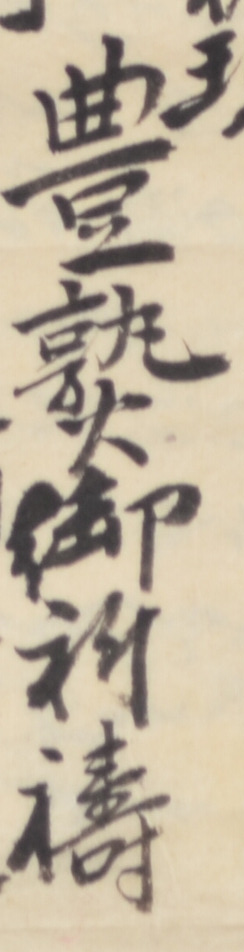豊熟御祈祷
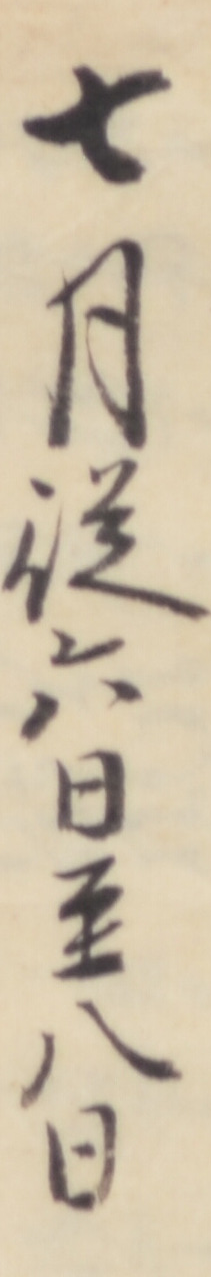七月従六日至八日

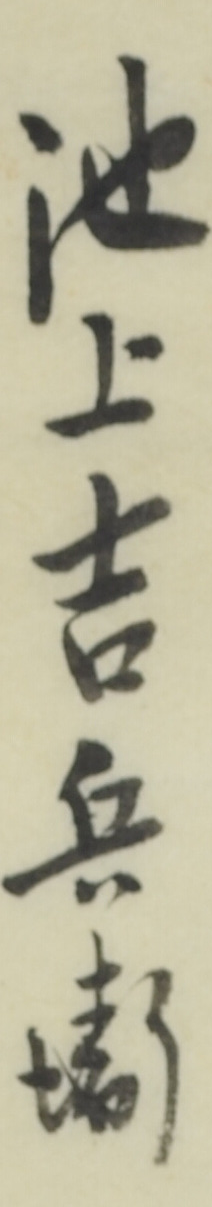池上吉兵衛
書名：鉾持権現二夜三日　豊熟御祈禱諸事控
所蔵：伊那市立高遠町図書館・合同会社AMANE
